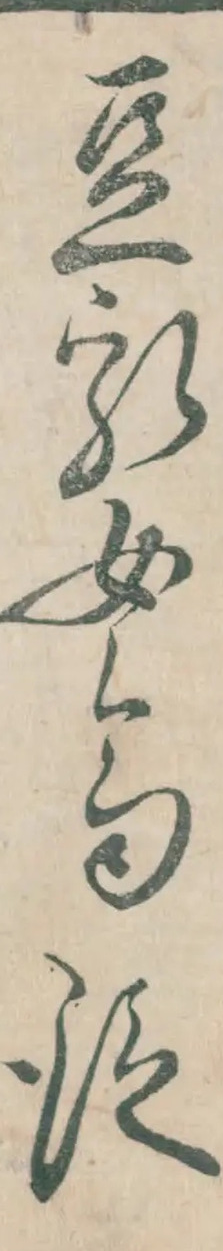豆乳女斎従

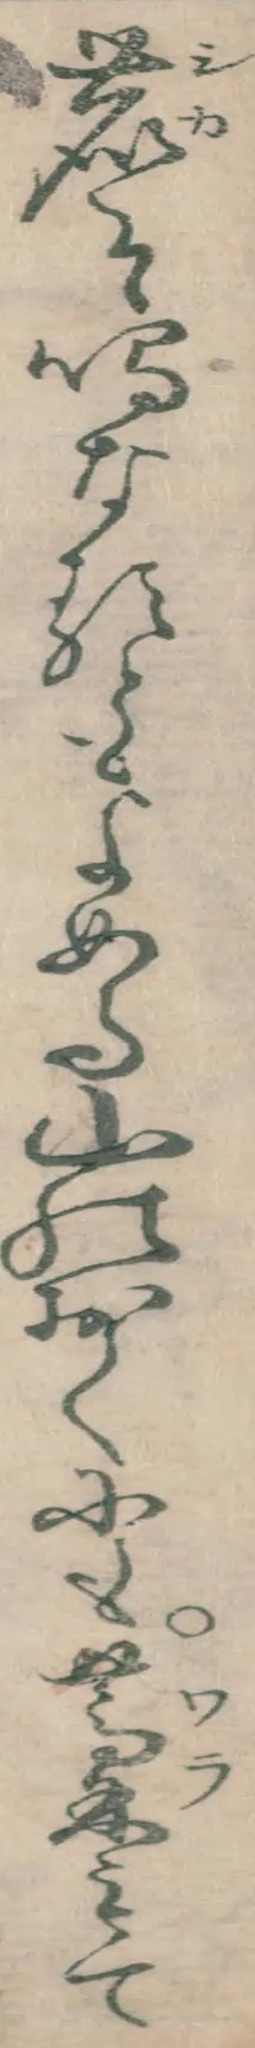鹿そ鳴なるともよめる山のおくにも。藁もて
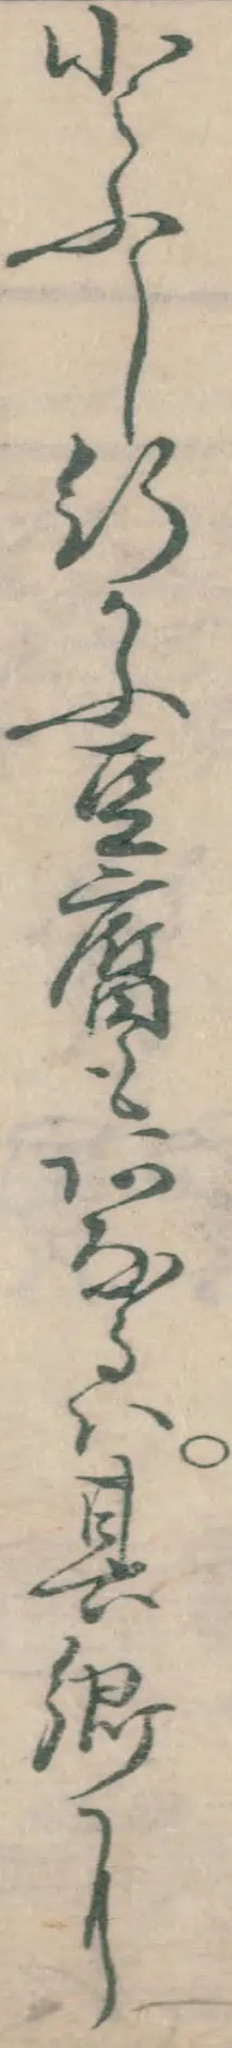とふし行かふ豆腐もあなるは。其郷に
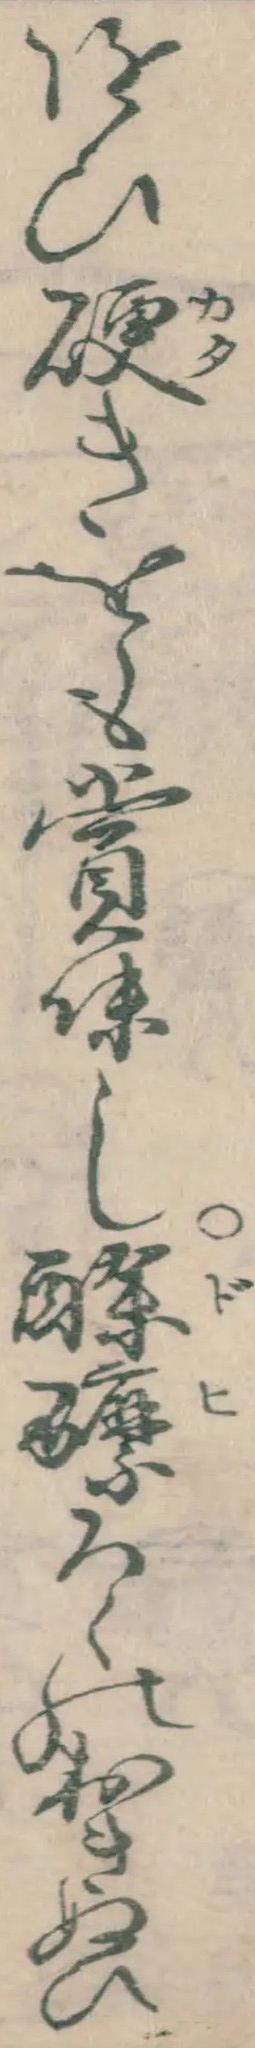随ひ硬きをも賞味し。酴醿ろくのおきぬひ
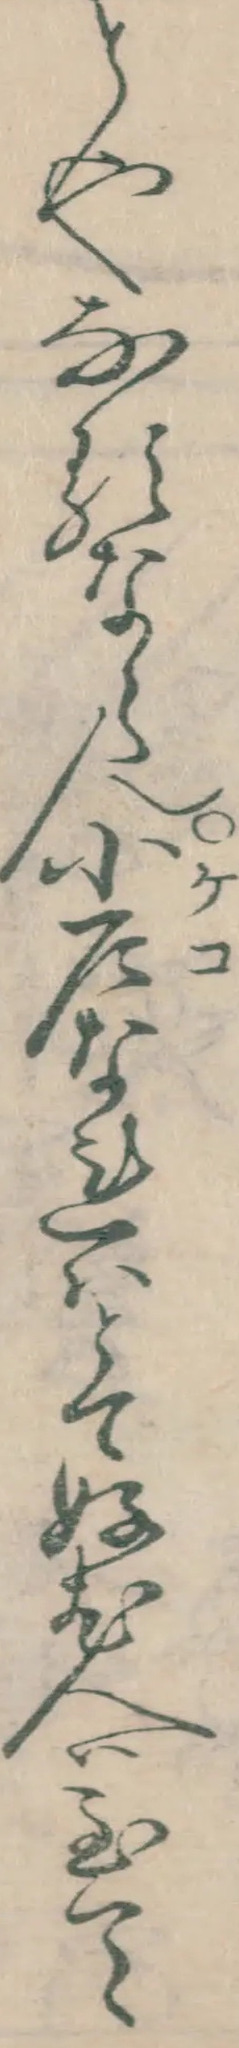とやなるならん。小戸なれはとて好む人は至て
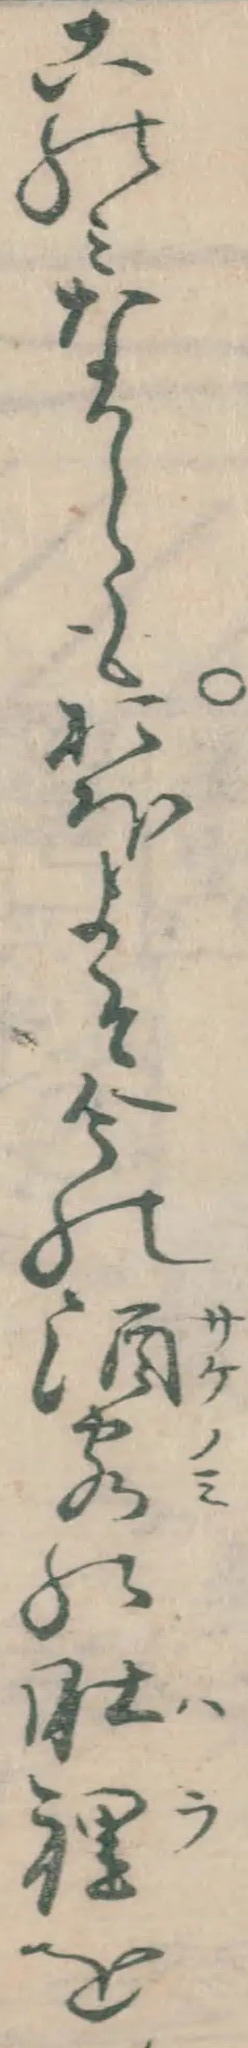このみなからも。おほよそ今の酒客の肚裏を
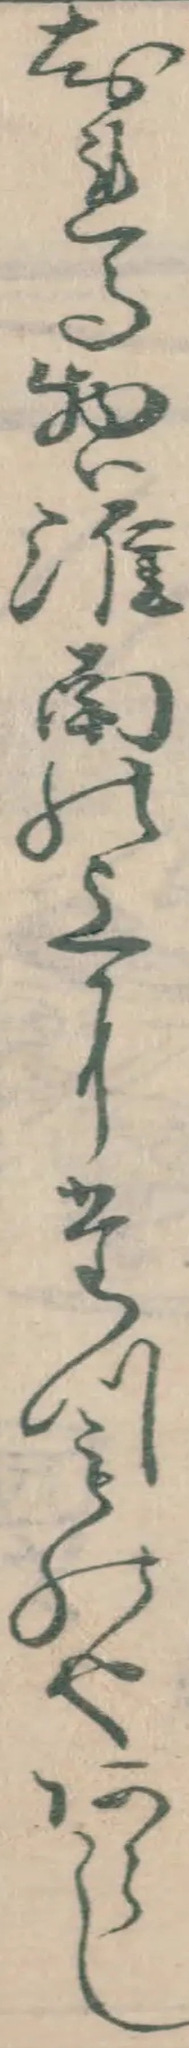知れる物は淮南の上にたつものやあらし。
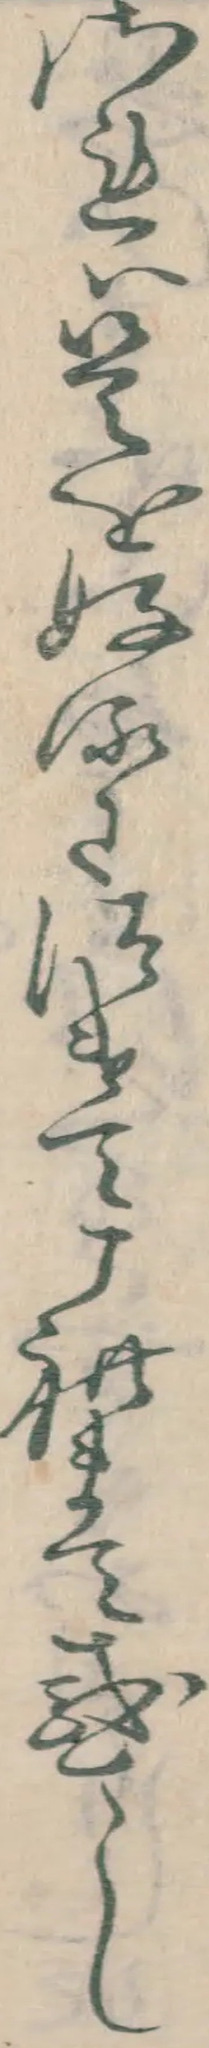されは是を好るにつけてこれまて感し
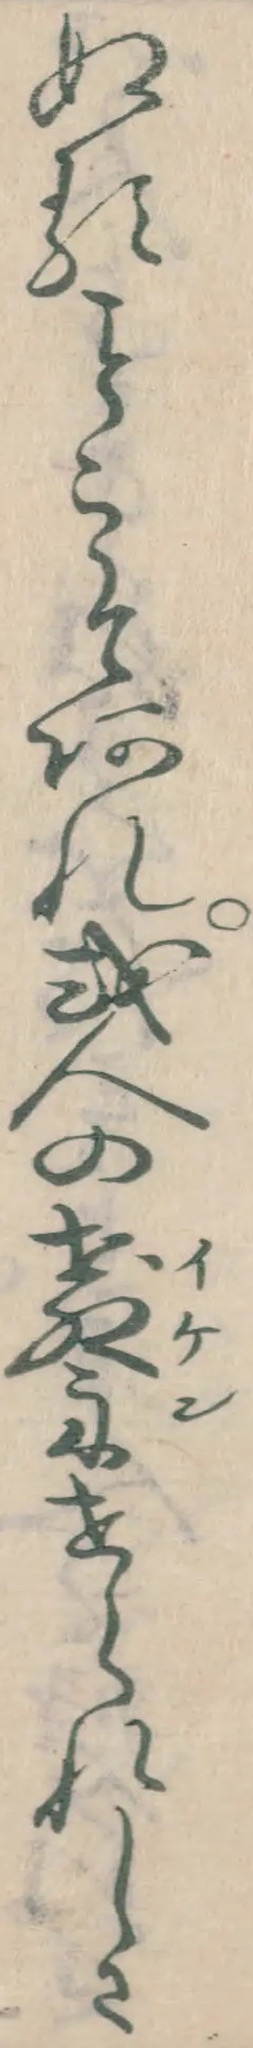ぬることこそあれ。或人の教示せられしに
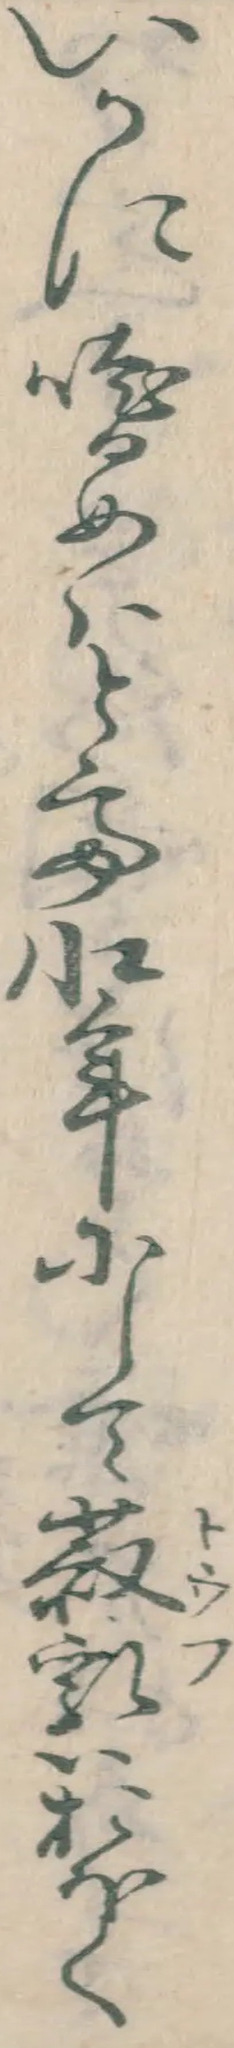いかに嗜めはとて壮年にして菽乳はおほく
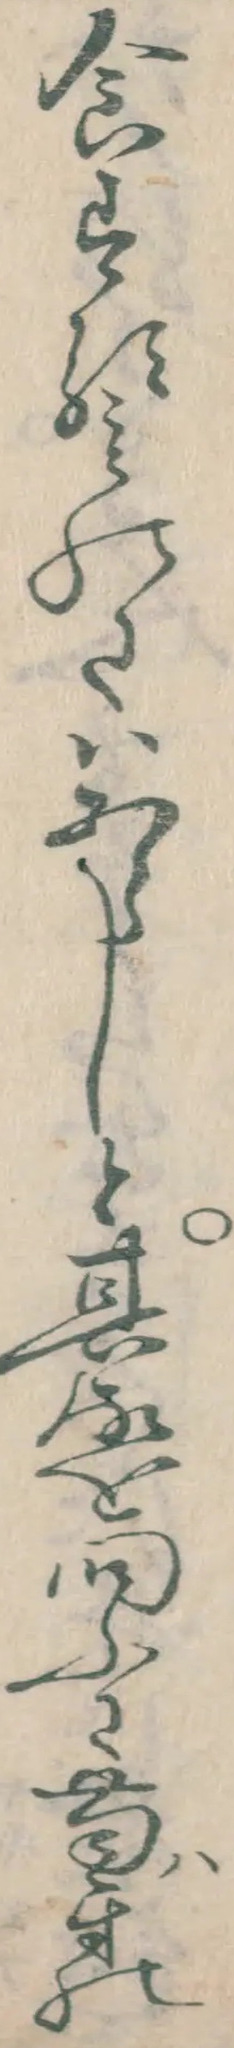食するものにはあらしと。其故を問ふに歯牙の
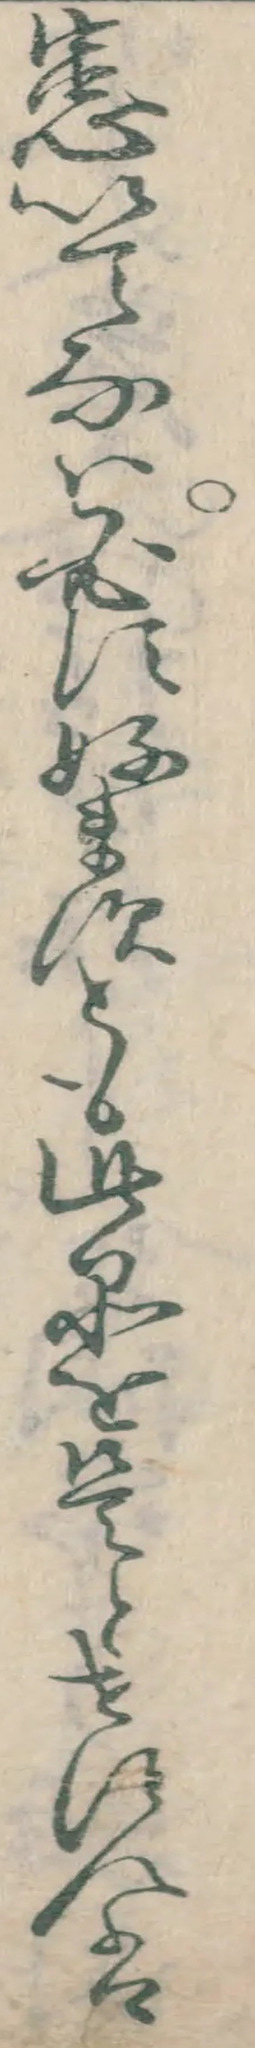患いてなは。必す好ますとも此品を是とせすんは
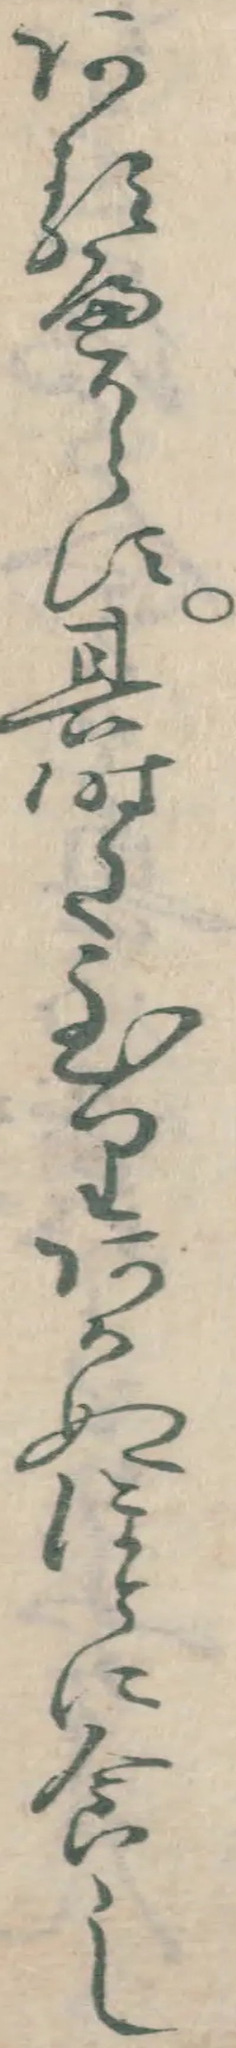あるへからす。其時に至りあかぬほとに食し

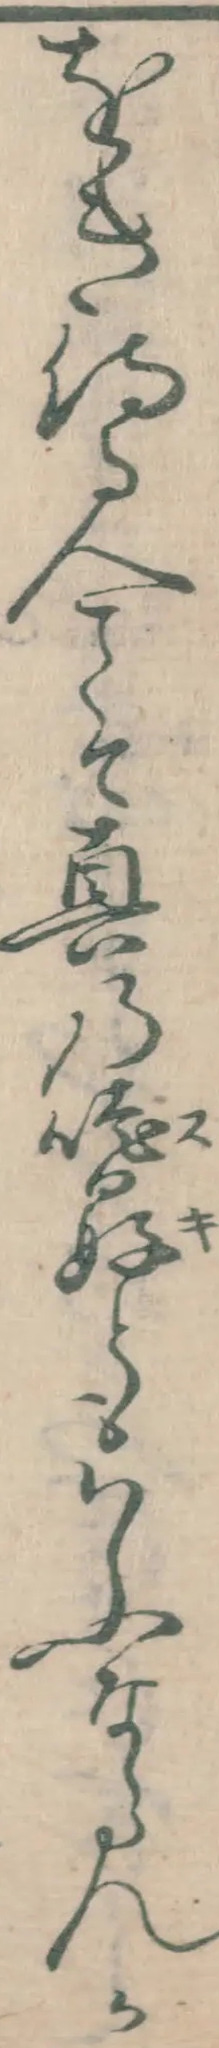をき侍る人こそ真の嗜好ともいふならんか
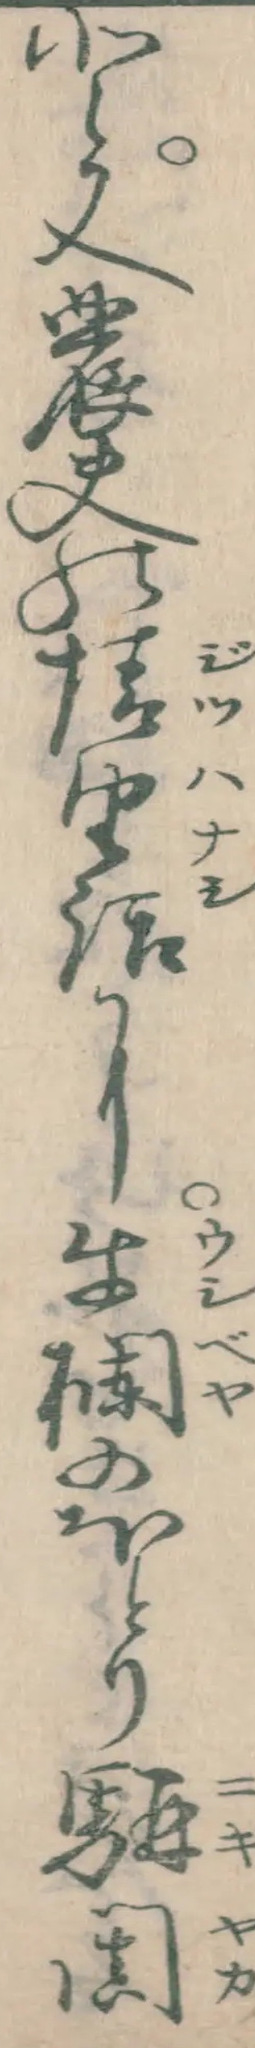と。又農夫の情由話に。牛欄のほとり駢闐
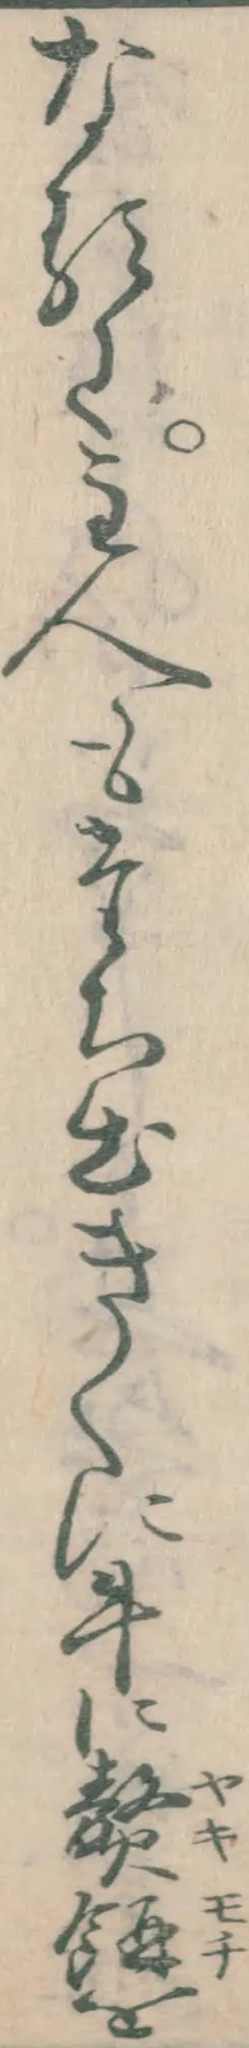なるに。主人もたち出きくに牛に熬餅を
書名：豆腐百珍. 続編
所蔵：国立国会図書館 National Diet Library, JAPAN
